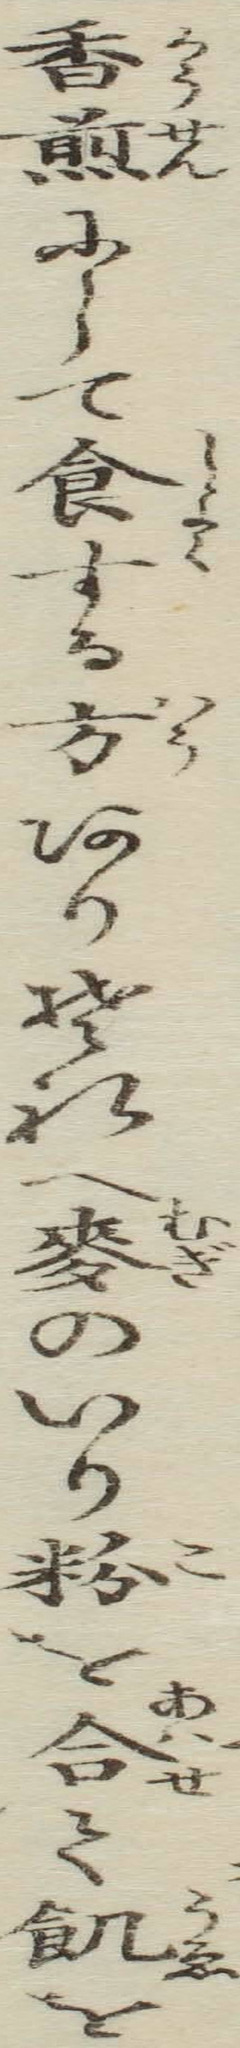香煎にして食する方ありそれへ麦のいり粉を合て飢を
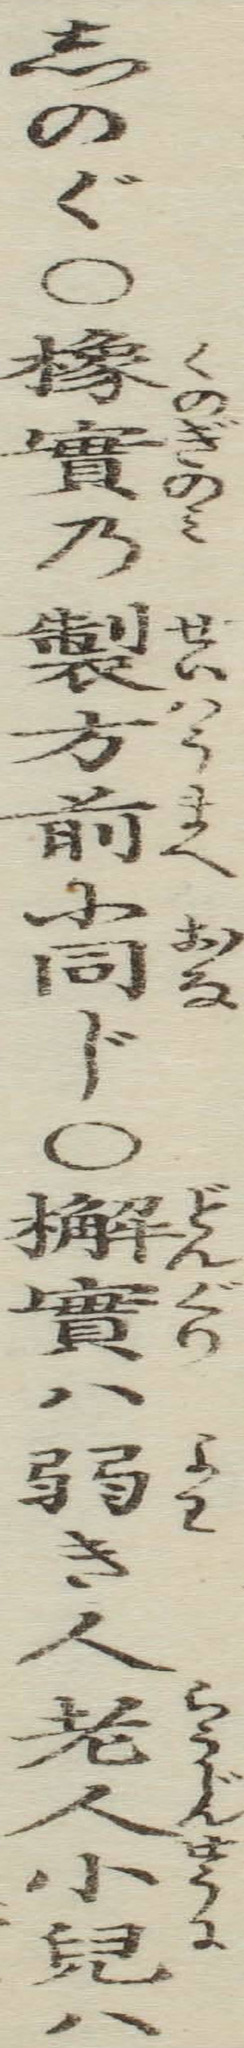しのぐ○橡實の製方前に同じ○檞實は弱き人老人小兒は
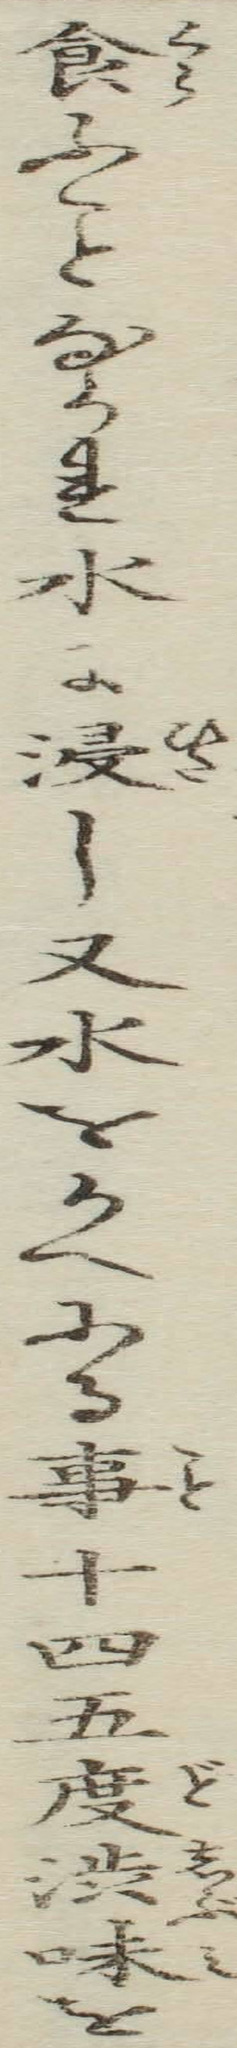食ふことなかれ水に浸し又水をかへにる事十四五度渋味を
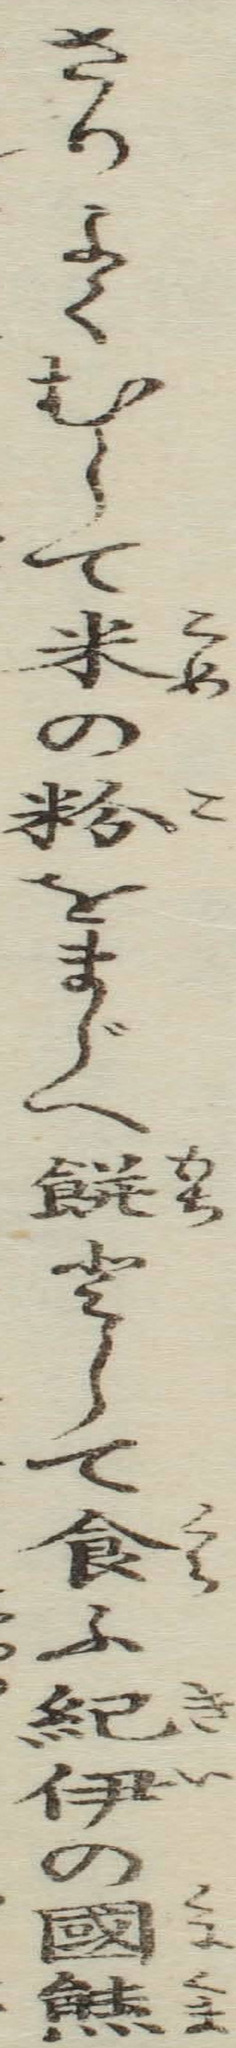さりよくむして米の粉をまじへ餅として食ふ紀伊の国熊
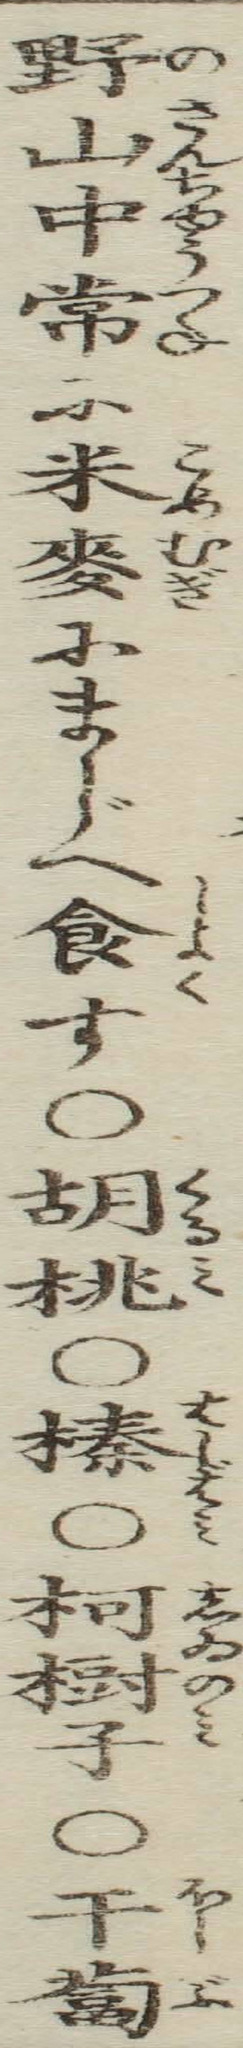野山中常に米麦にまじへ食す○胡桃○榛○柯樹子○干蔔

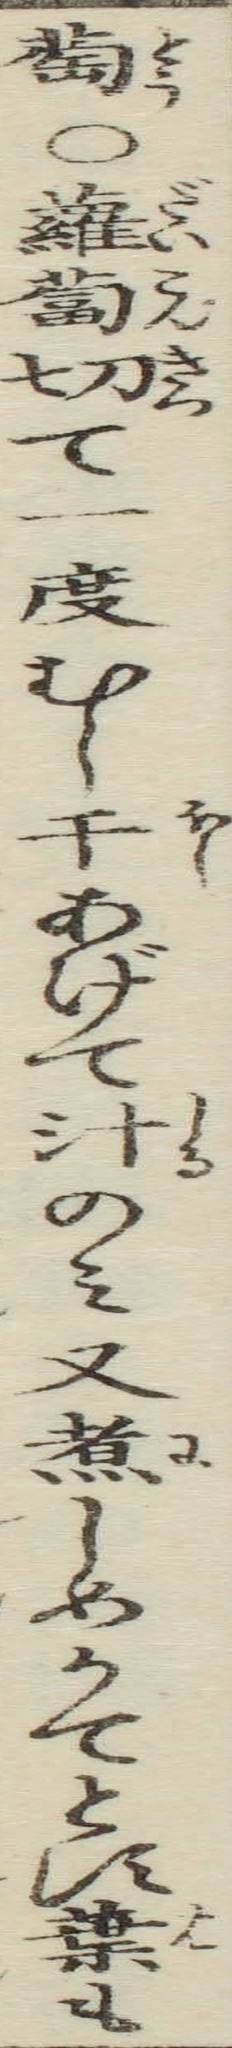萄○蘿蔔切て一度むし干あげて汁のみ又煮しめかてとす葉も
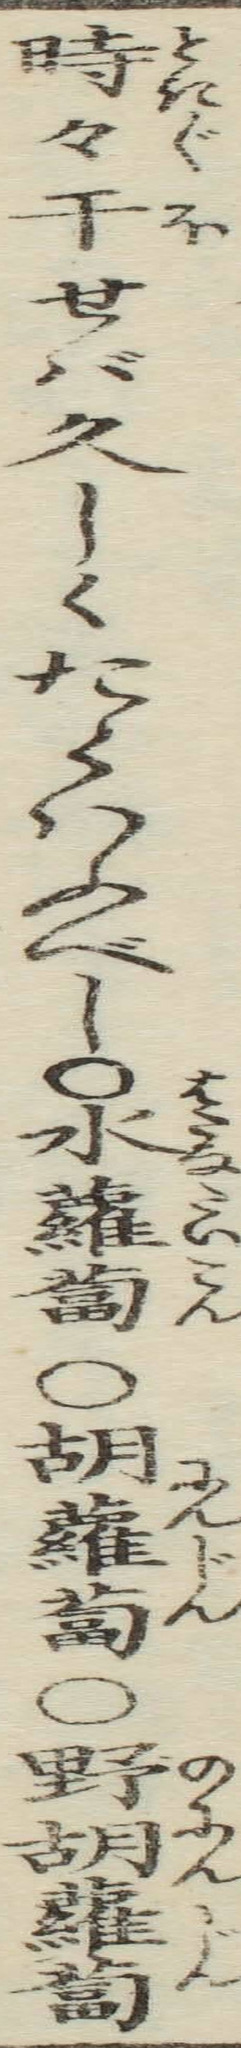時々干せば久しくたくはふべし○水蘿蔔○胡蘿蔔○野胡蘿蔔
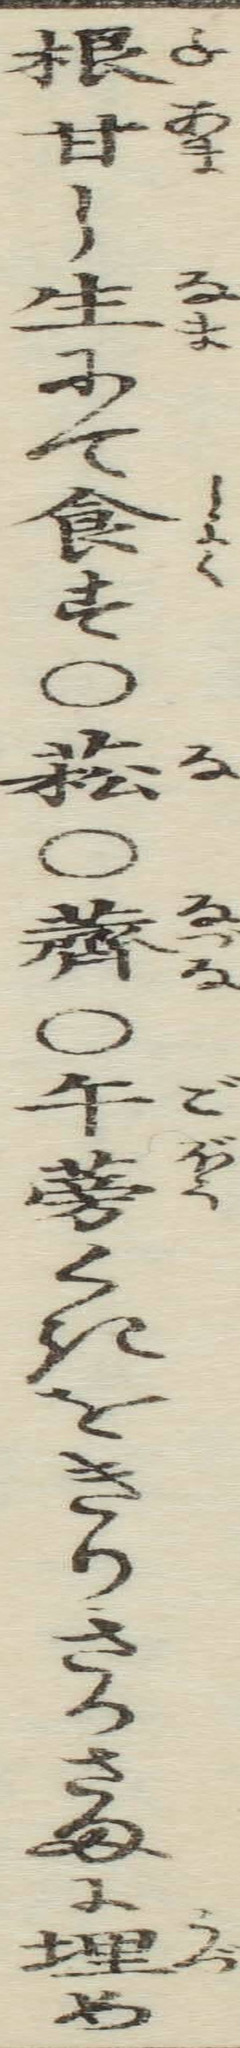根甘し生にて食す○菘○薺○牛蒡くきをきりさかさまに埋め
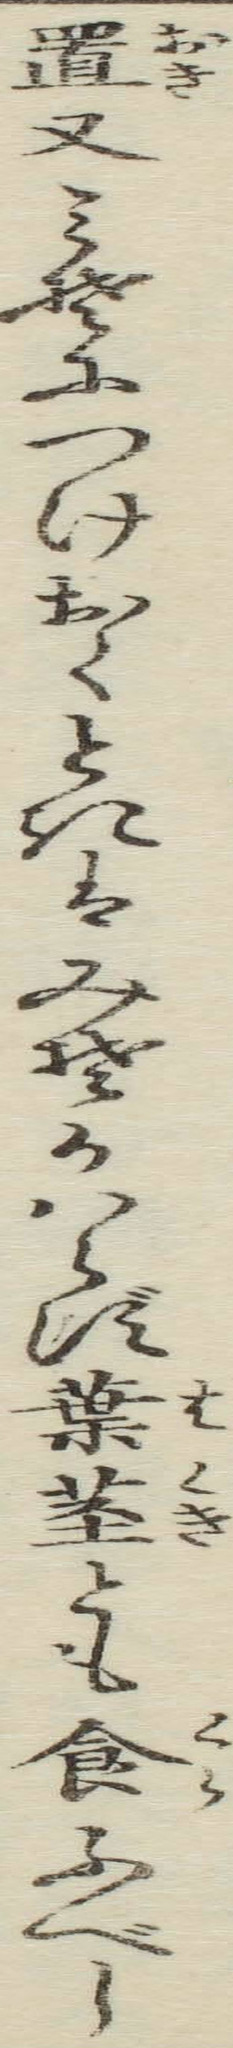置又みそにつけおくときはみそかはらず葉茎とも食ふべし
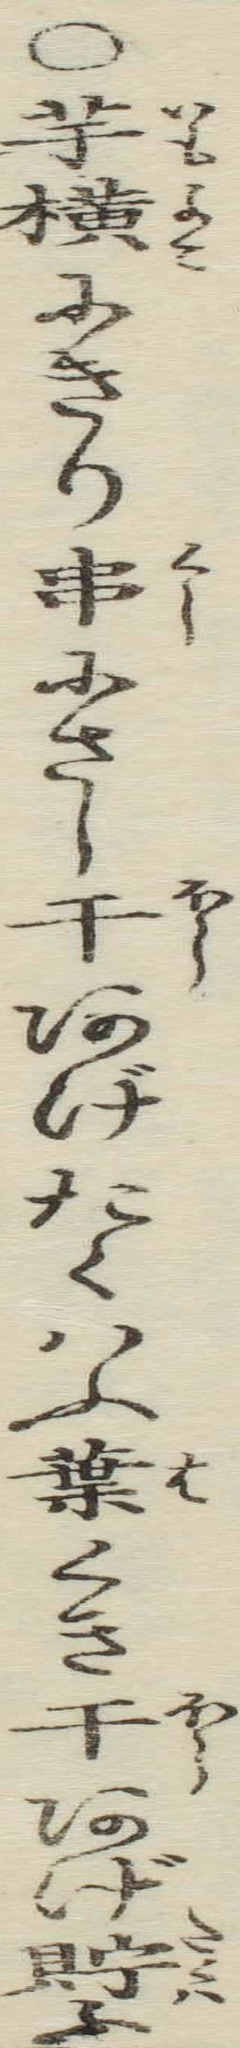○芋横にきり串にさし干あげたくはふ葉くき干あげ貯ふ
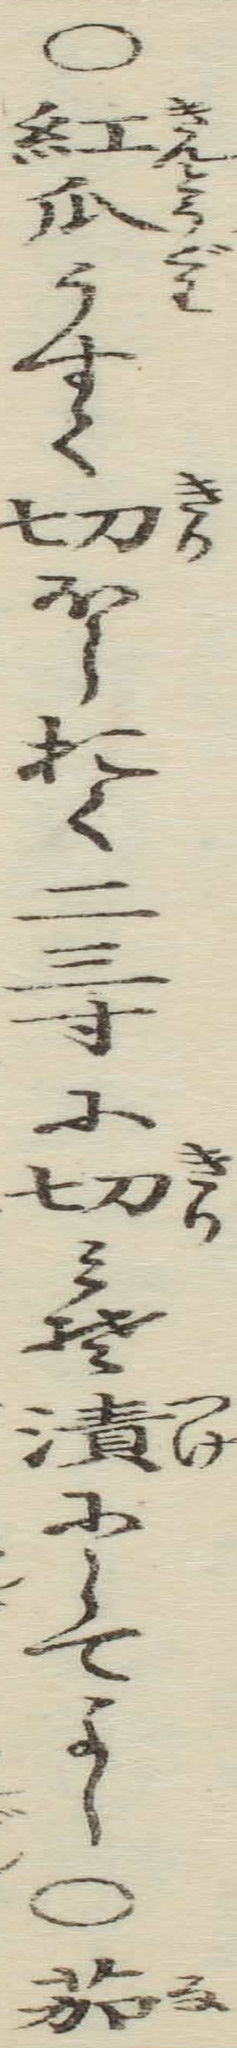○紅瓜うすく切ほしおく二三寸に切みそ漬にしてよし○茄
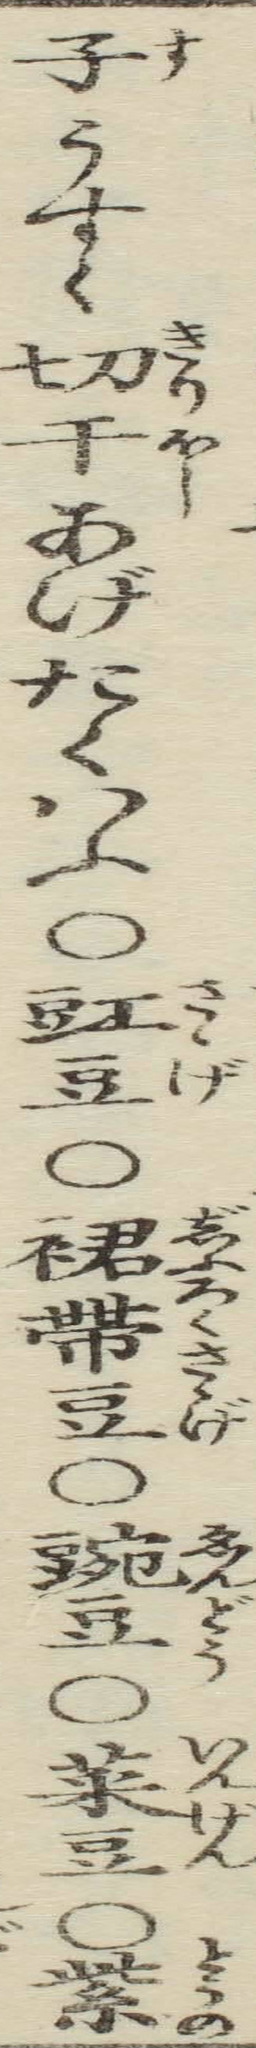子うすく切干あげたくはふ○豇豆○裙帯豆○豌豆○菜豆○紫
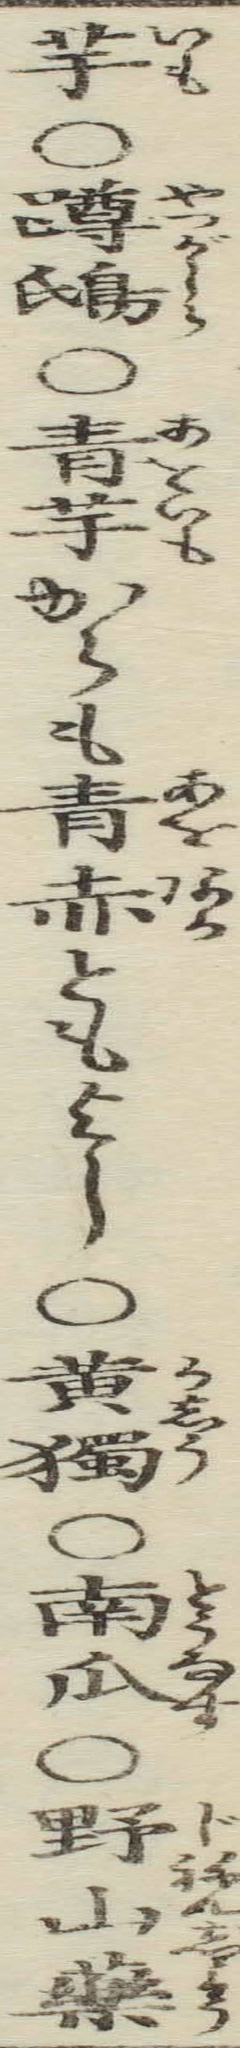芋○蹲鴟○青芋からも青赤ともよし○黄独○南瓜○野山薬
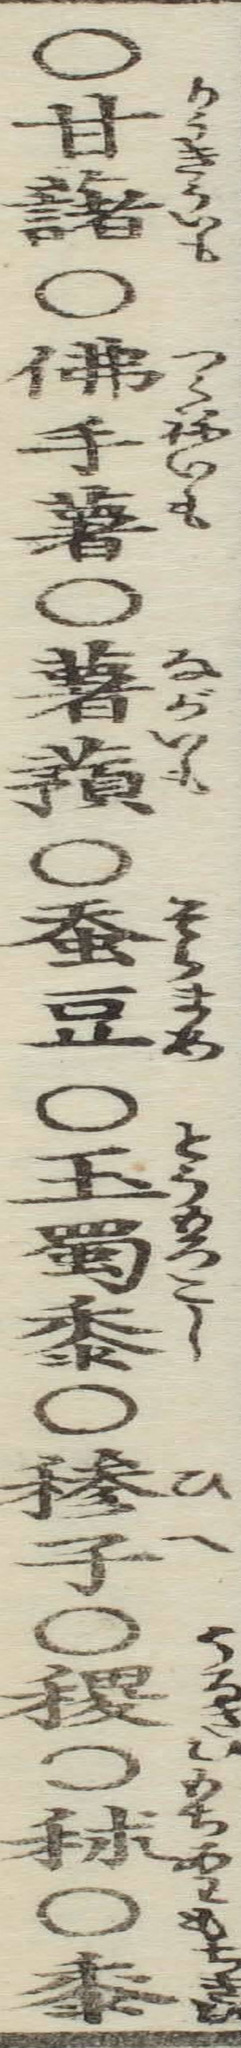○甘藷○仏手薯○薯蕷○蚕豆○玉蜀黍○䅟子○稷○秫○黍
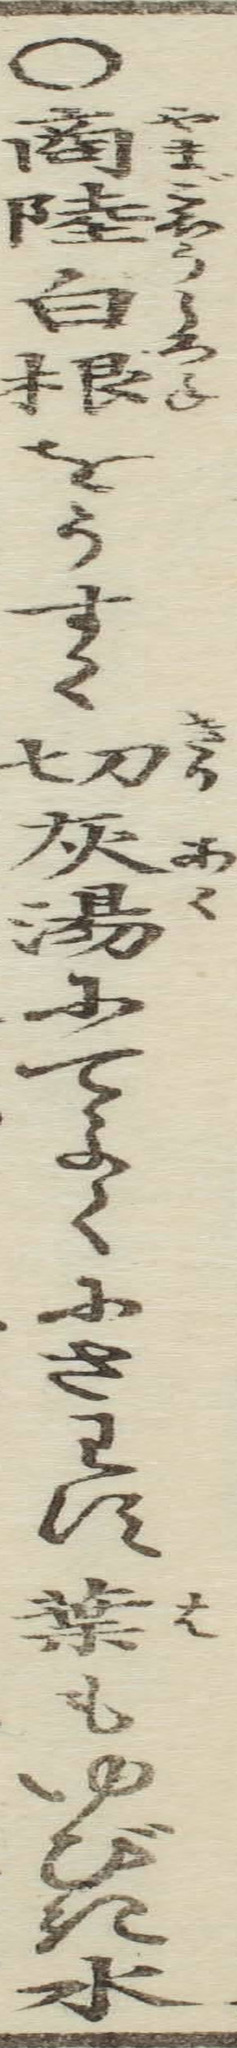○商陸白根をうすく切灰湯にてよくにさわす葉もゆびき水
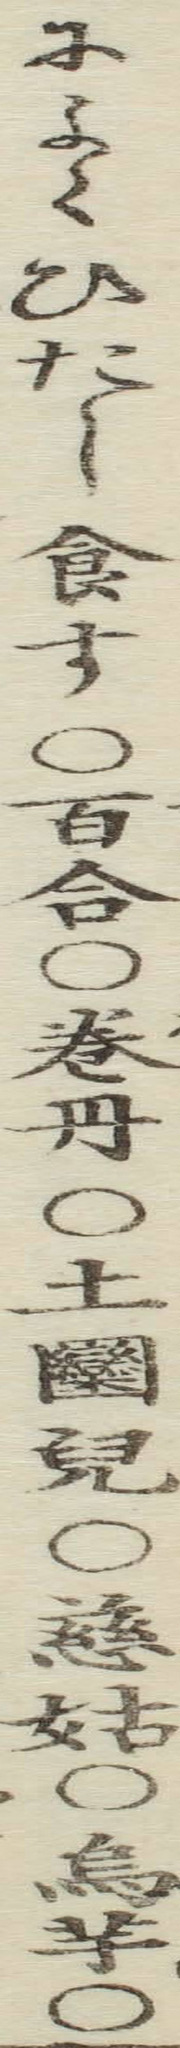によくひたし食す○百合○巻丹○土圞兒○慈姑○烏芋○
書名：救荒便覧
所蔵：国文学研究資料館
